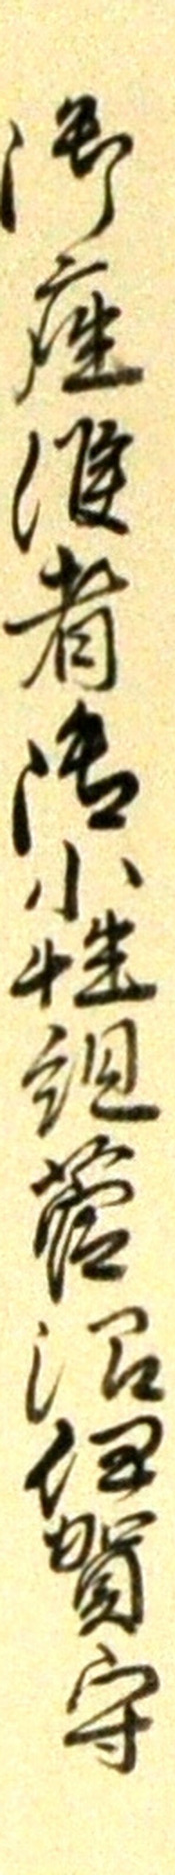御座候者御小姓組菅沼伊賀守
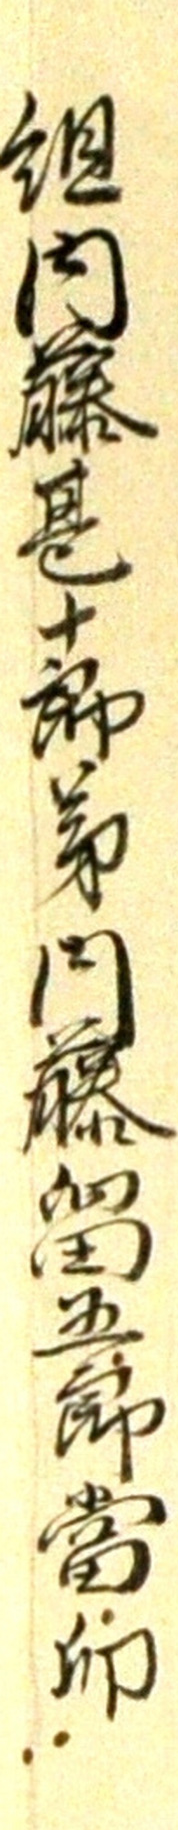組内藤甚十郎弟内藤留五郎当卯
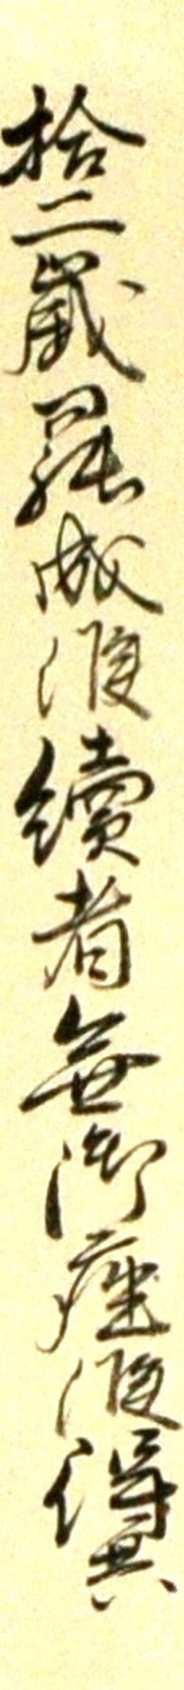拾二歳罷成候続者無御座候得共
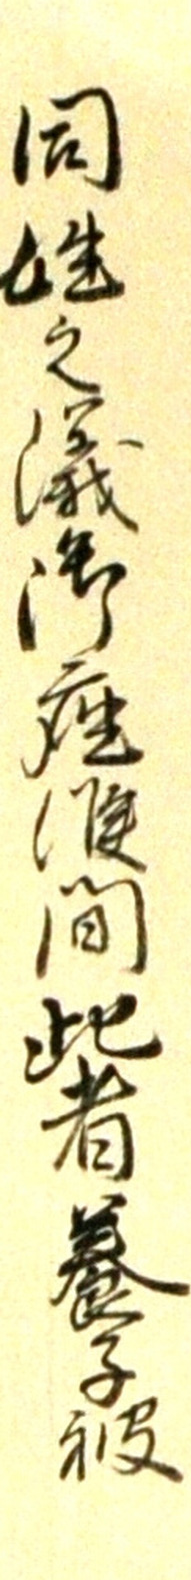同姓之儀御座候間此者養子被
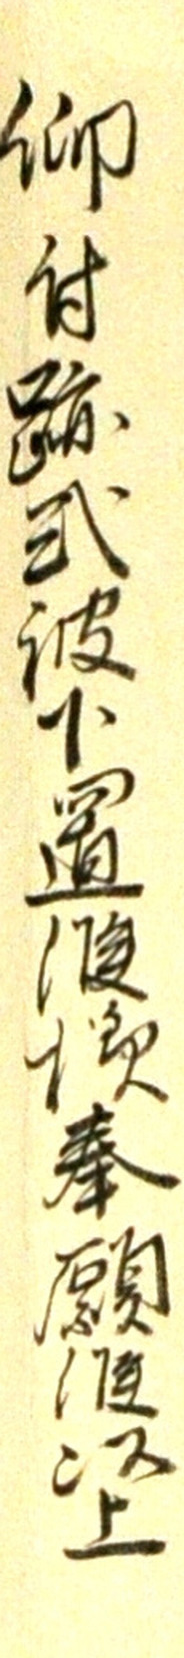仰付跡式被下置候様奉願候以上
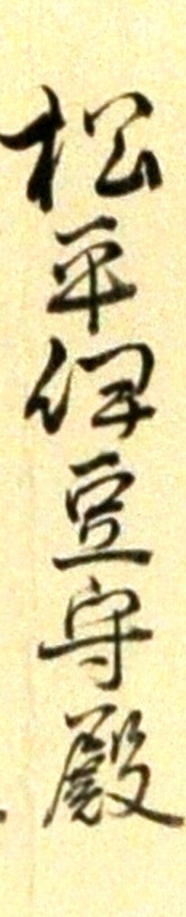松平伊豆守殿
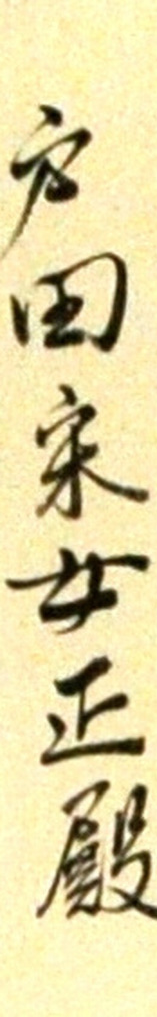戸田采女正殿
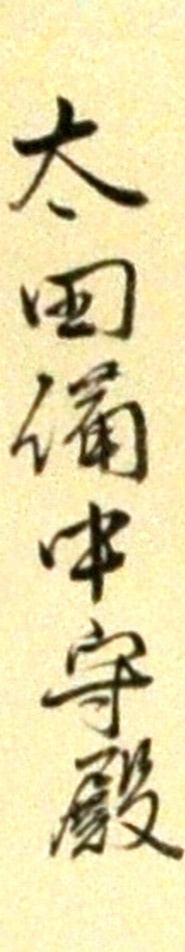太田備中守殿
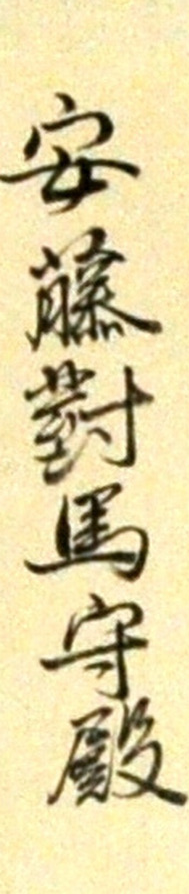安藤対馬守殿
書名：仮養子願
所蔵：伊那市立高遠町図書館・合同会社AMANE
